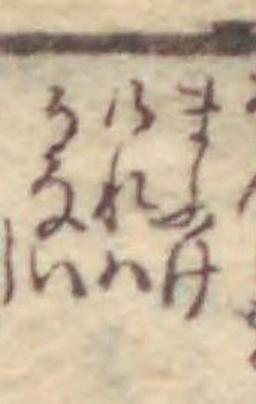かない
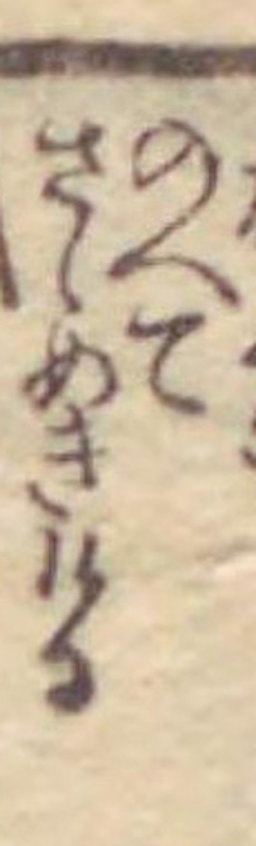さゝめきける
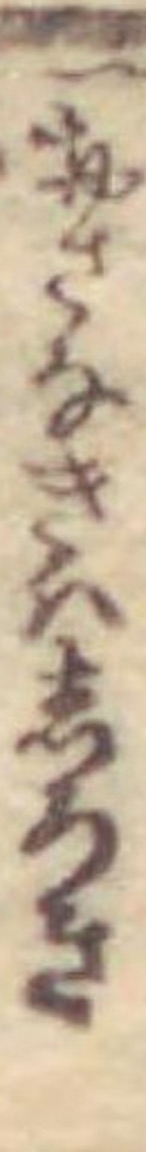〽おさなきはしろき
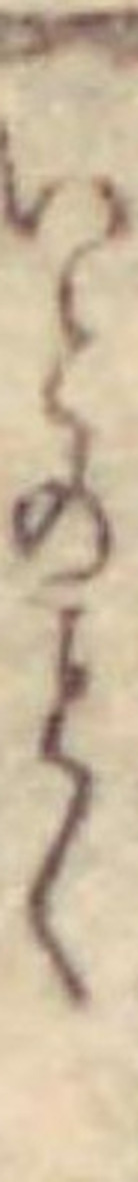いとのことく
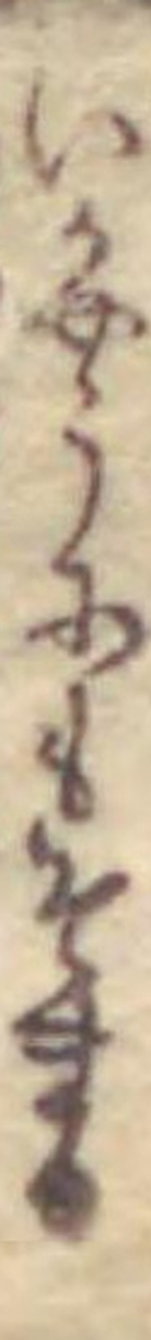いかやうにもそまる
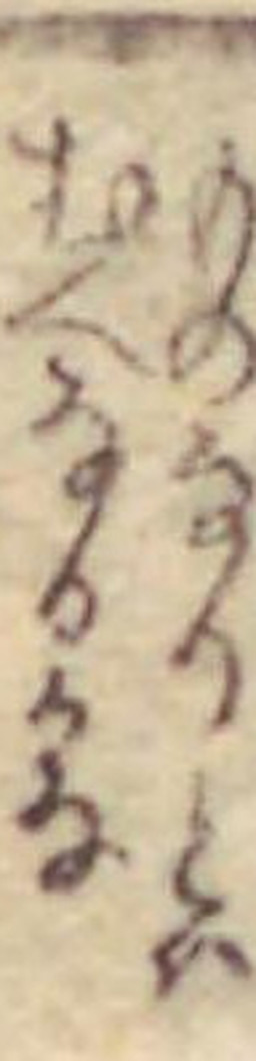むへなるかな
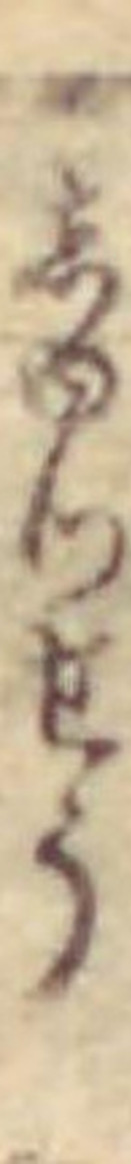しゆつせう
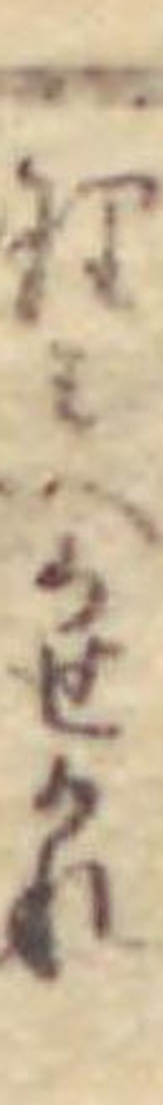理兵へかせかれ
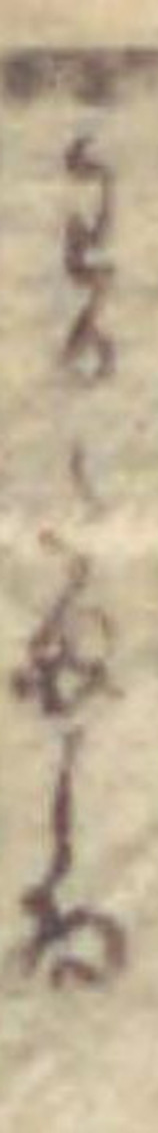わるたましゐ
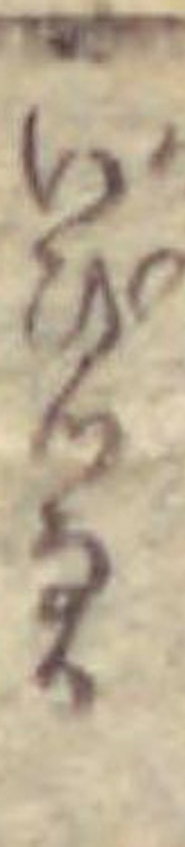いひつなる
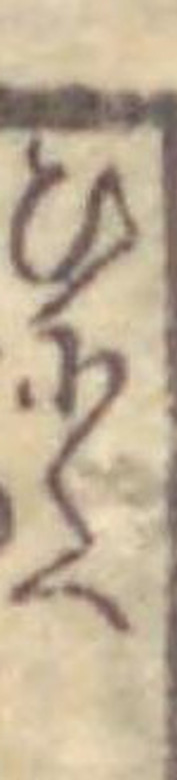ひにくへ
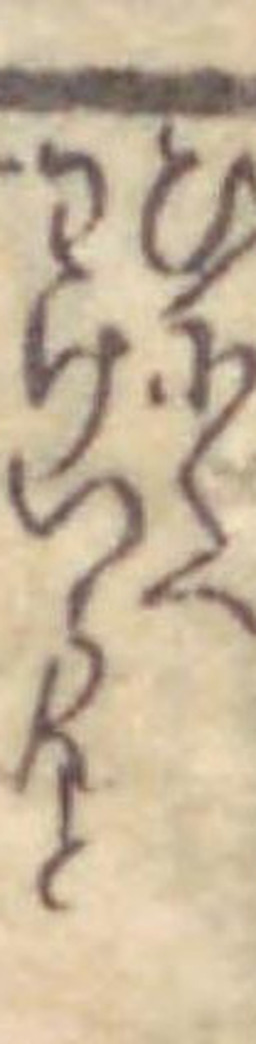わけいらんと
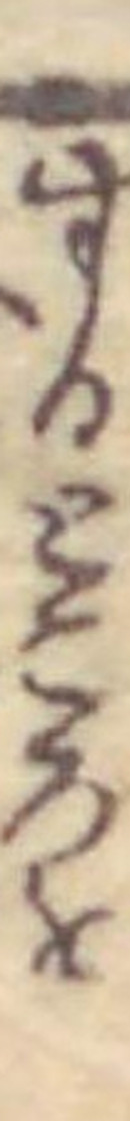するところを
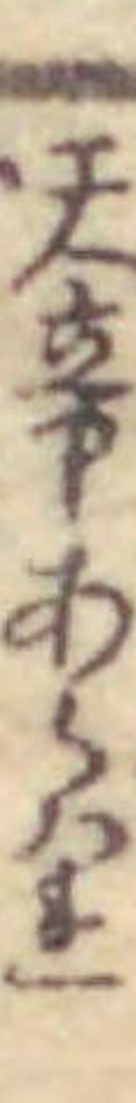天帝あらはれ
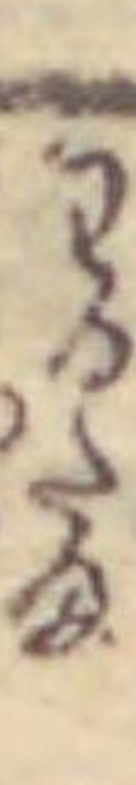わるたま
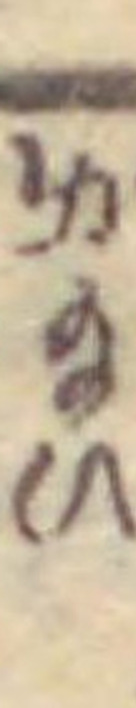出給ひ
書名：心学早染艸 : 3巻
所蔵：国立国会図書館 National Diet Library, JAPAN
